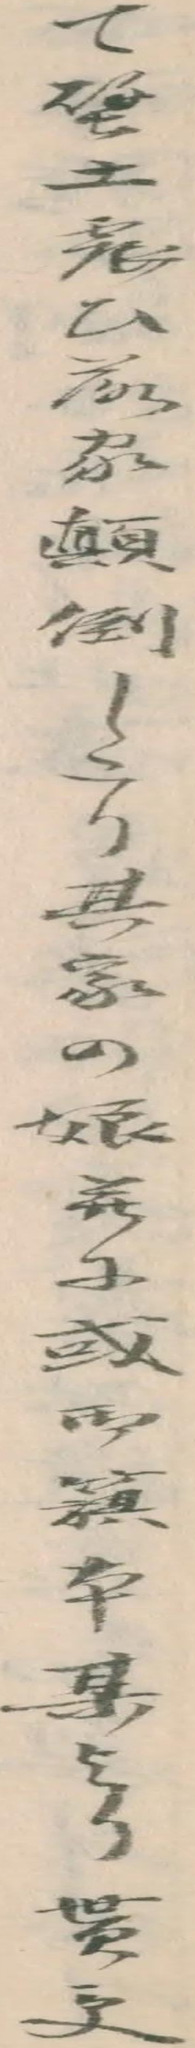て壁土震ひ落家顛倒したり其家の娘并に或御籏本某より貰受
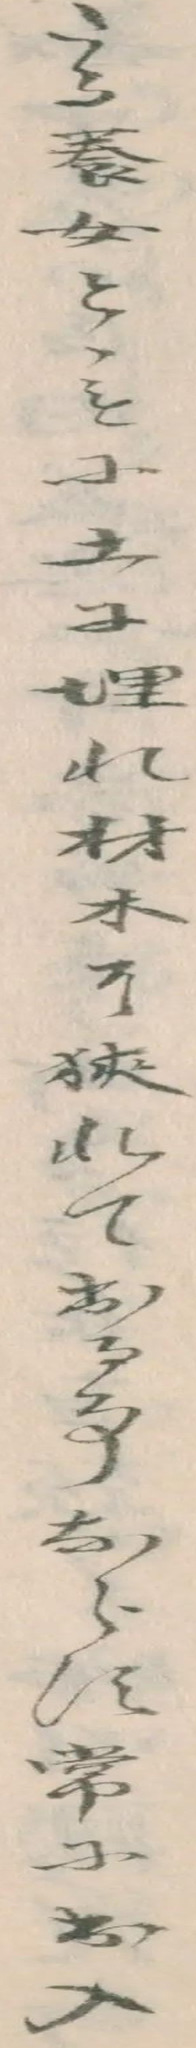たる養女とゝもに土に埋れ材木に挟れて出る事ならす常に出入
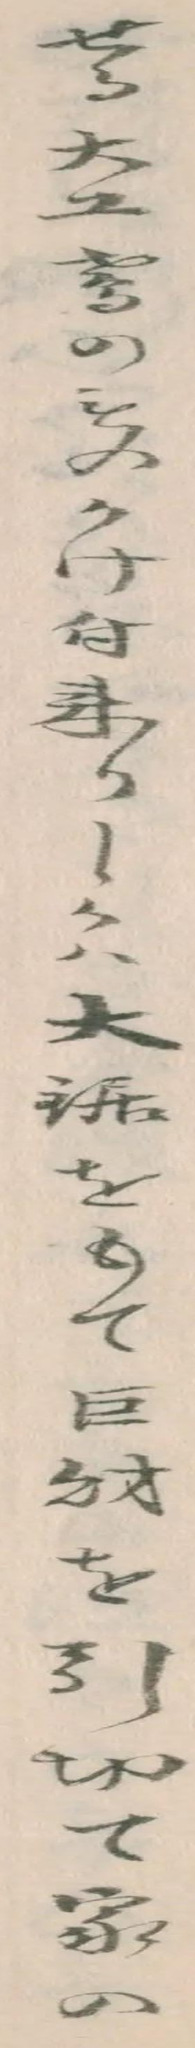せる大工鳶のものかけ付来りしかは大鋸をもて巨財を引切て家の
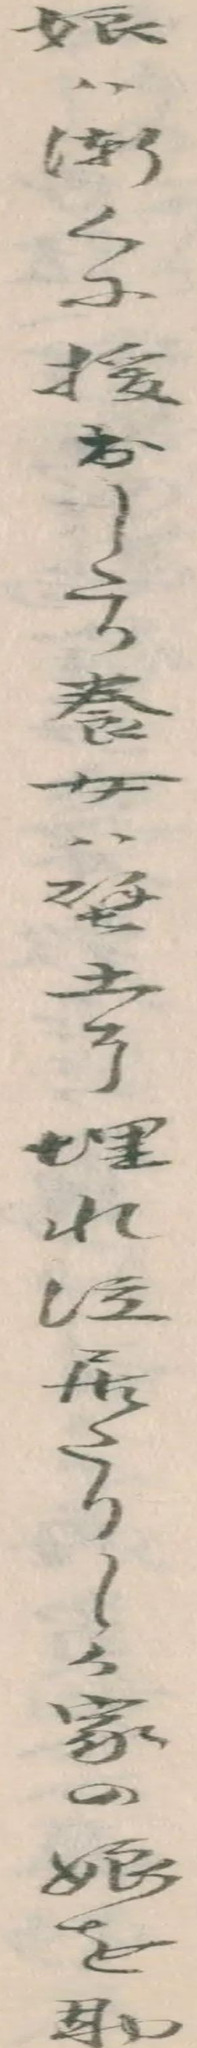娘は漸くに援出したり養女は壁土に埋れ泣居たりしか家の娘を助
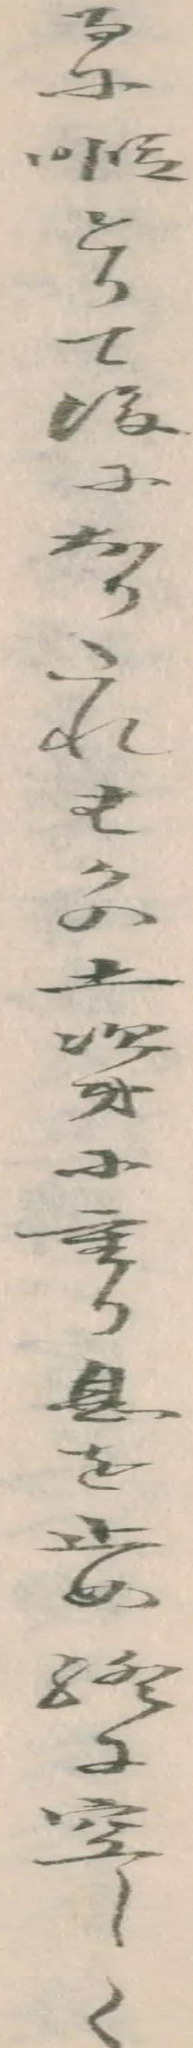るに暇とりて後になりたれはかの土次第に重り息を止め終に空しく
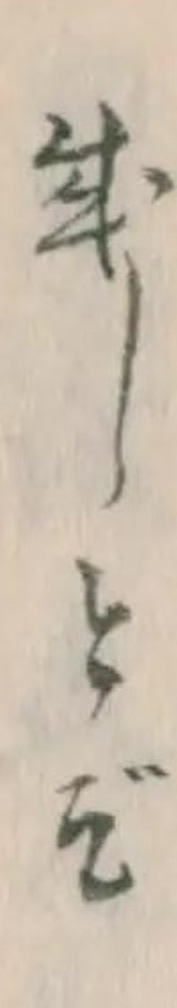成しとぞ
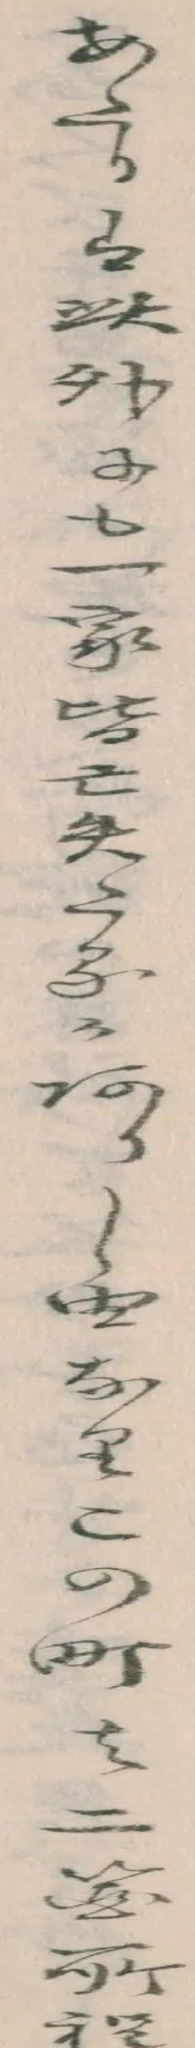あたりは此外にも一家皆亡失たるかありし由なりこの町は二箇所程
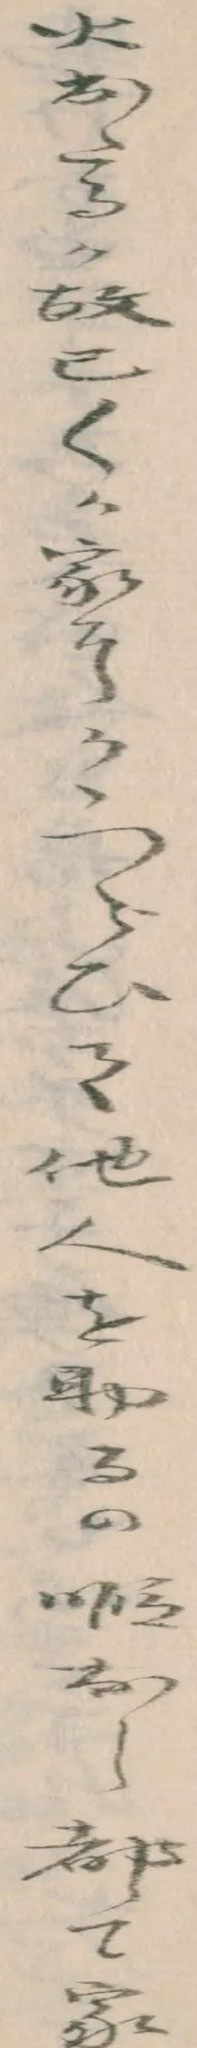火出たるか故己〳〵か家にかゝつらひて他人を助るの暇なし都て家
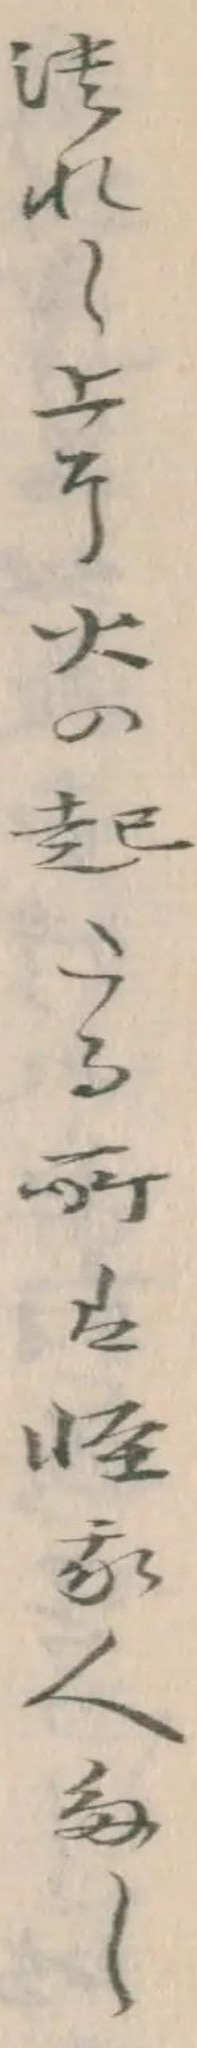潰れし上に火の起たる所は怪我人多し
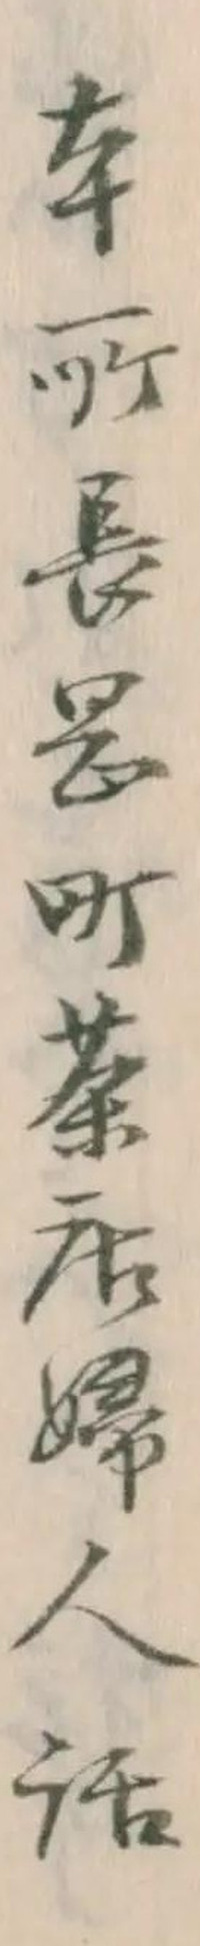本所長岡町茶店婦人話
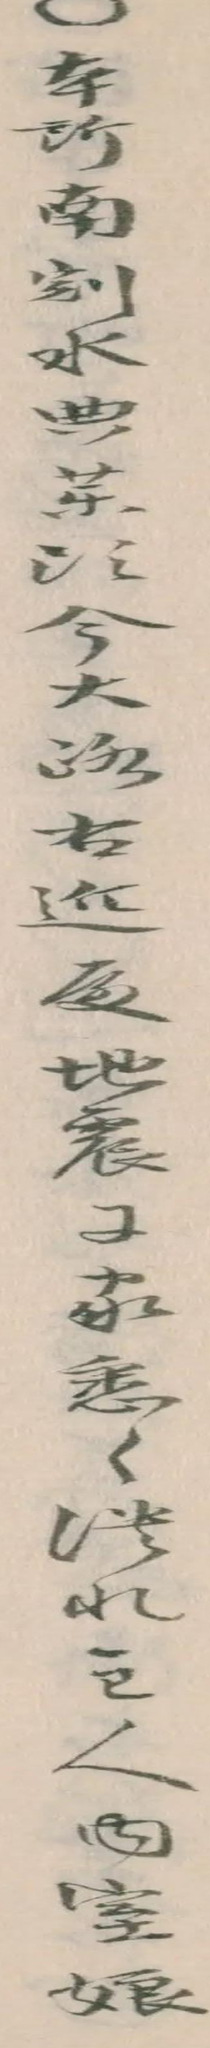〇本所南割水典薬頭今大路右近殿地震に家悉く潰れ主人内室娘
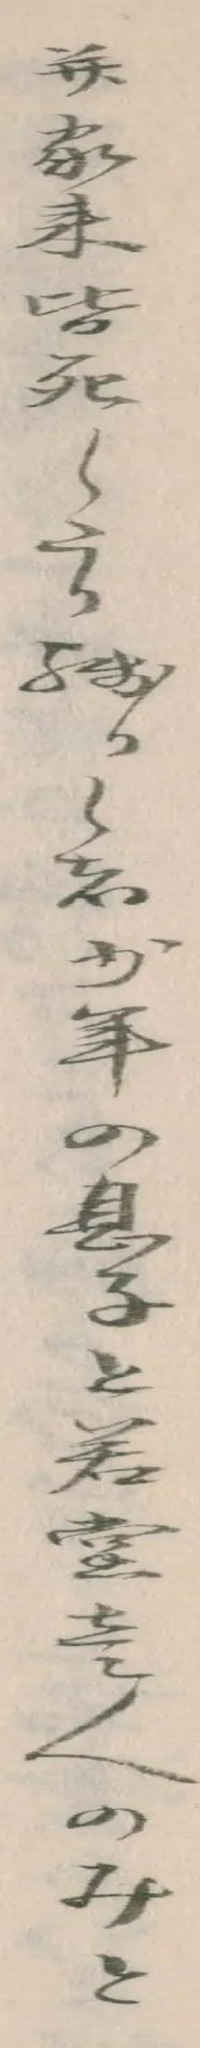并家来皆死したり残りし者少年の息子と若党壱人のみと
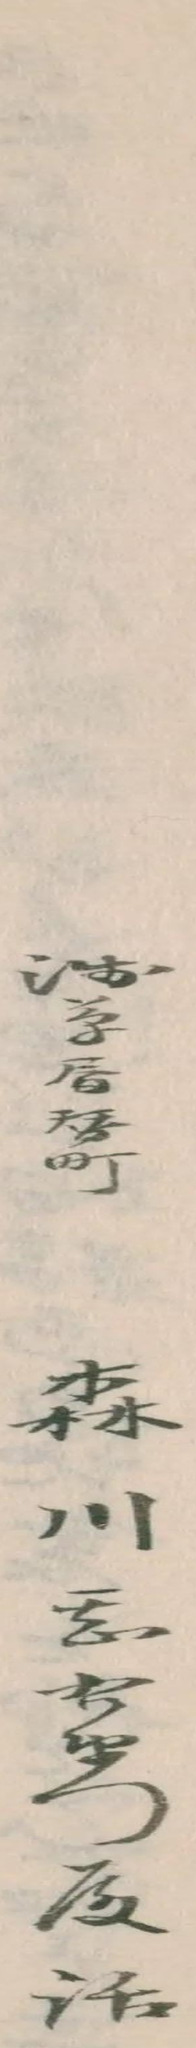浅草書替町森川甚右衛門殿話
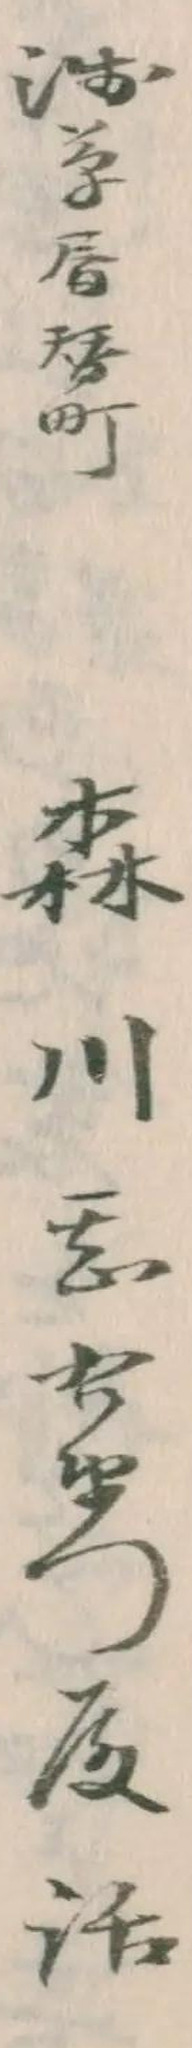浅草書替町森川甚右衛門殿話
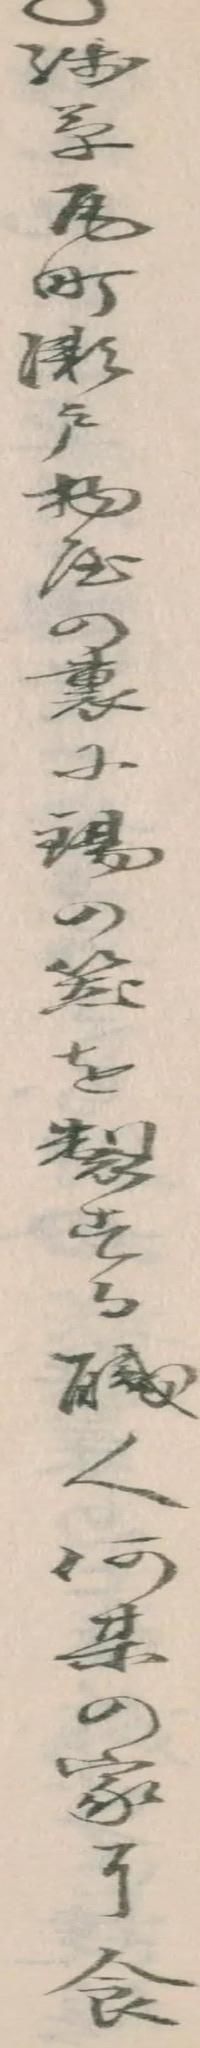〇浅草瓦町瀬戸物屋の裏に錫の器を製する職人何某の家に食
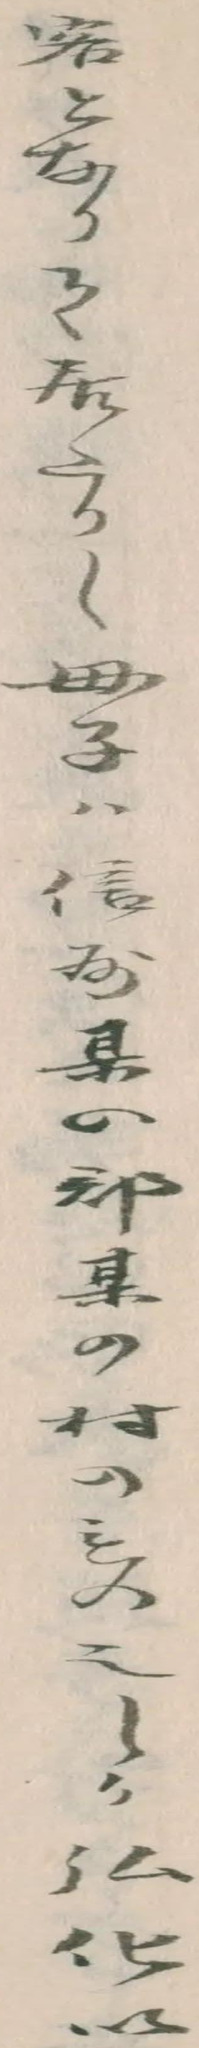客となりて居たりし母子は信州某の郡某の村の者也しか弘化以
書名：地災撮要. 巻7-9(地震之部)
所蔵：国立国会図書館 National Diet Library, JAPAN
